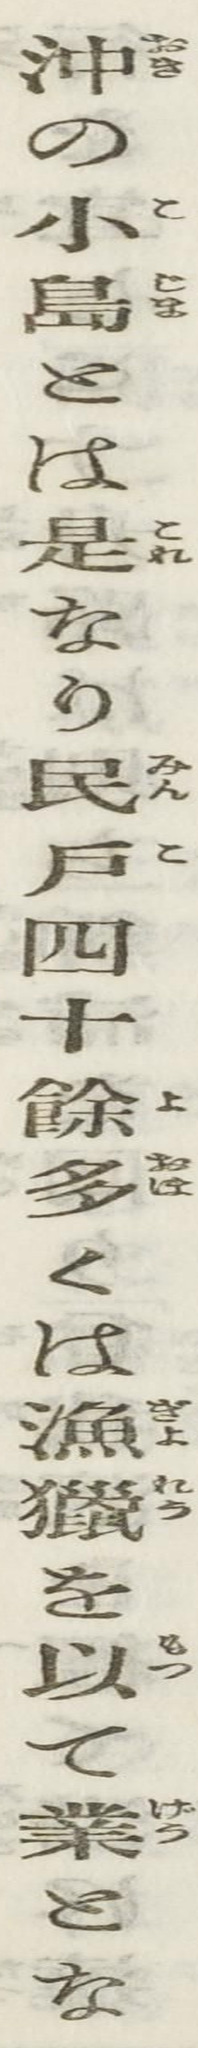沖の小島とは是なり民戸四十餘多くは漁猟を以て業とな
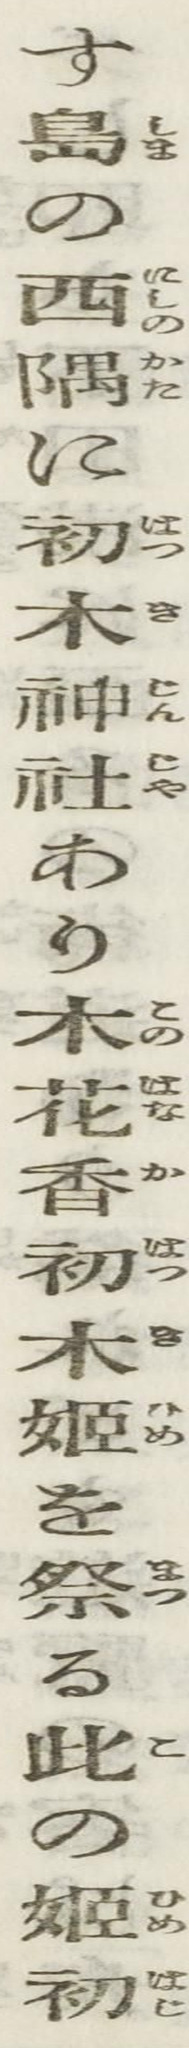す島の西隅に初木神社あり木花香初木姫を祭る此の姫初
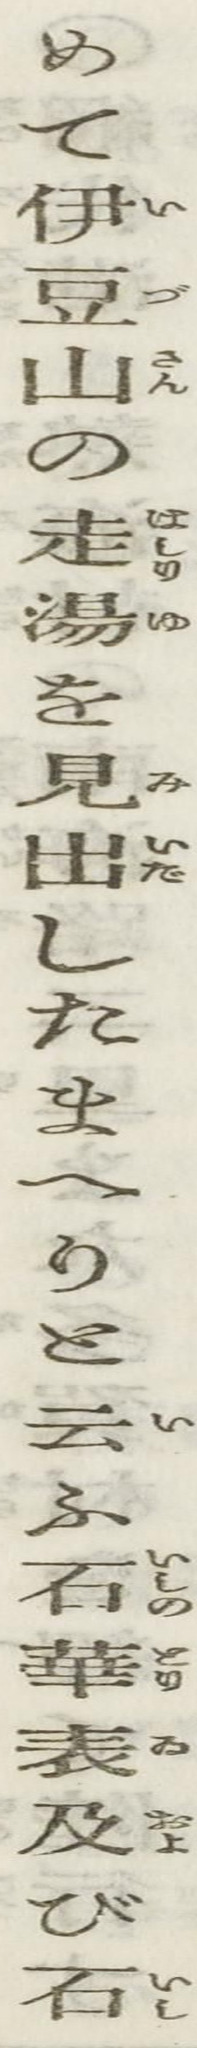めて伊豆山の走湯を見出したまへりと云ふ石華表及び石
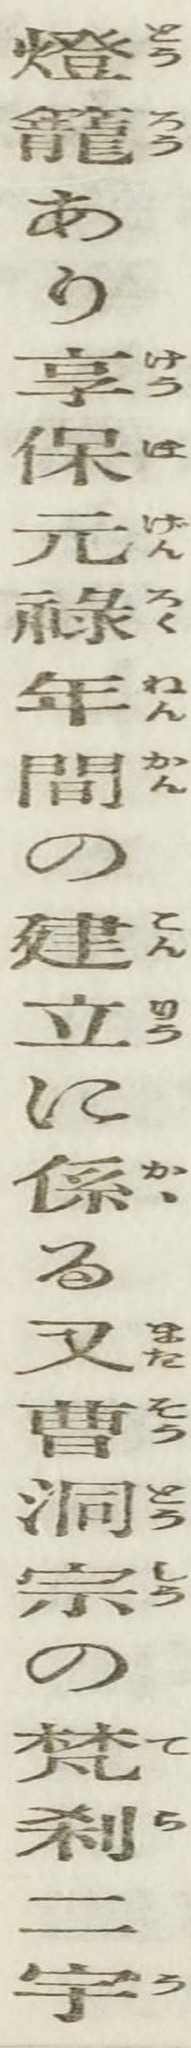燈籠あり享保元禄年間の建立に係る又曹洞宗の梵刹二宇
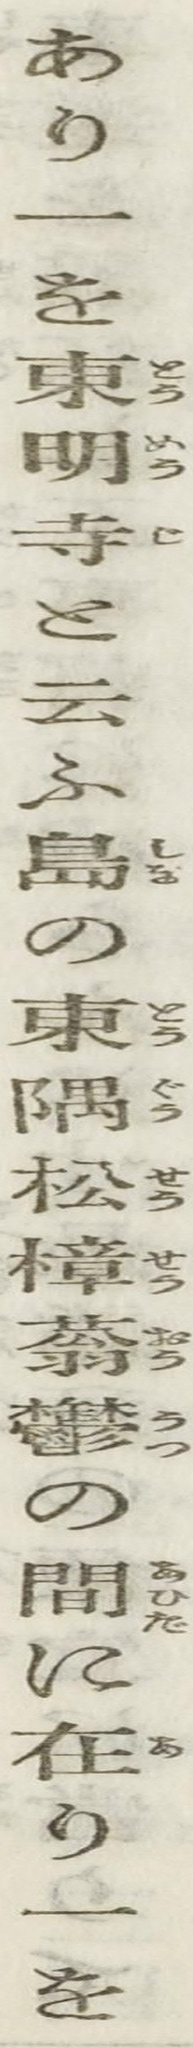あり一を東明寺と云ふ島の東隅松樟蓊鬱の間に在り一を
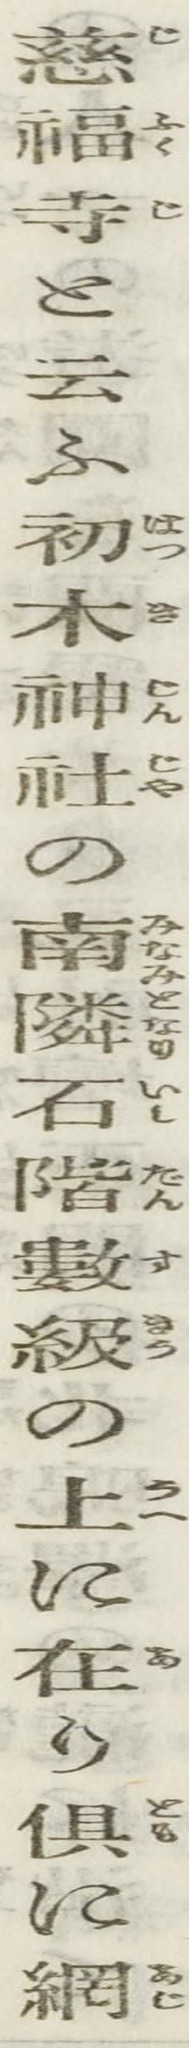慈福寺と云ふ初木神社の南隣石階数級の上に在り俱に網
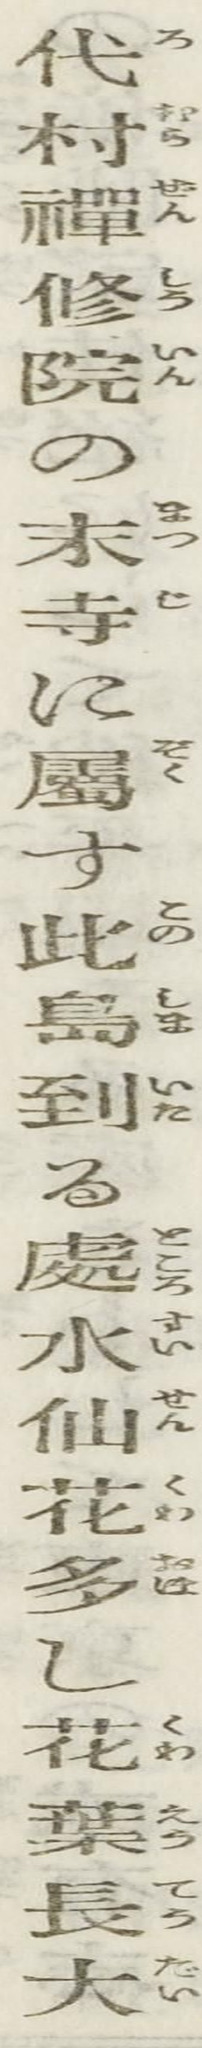代村禪修院の末寺に属す此島到る處水仙花多し花葉長大
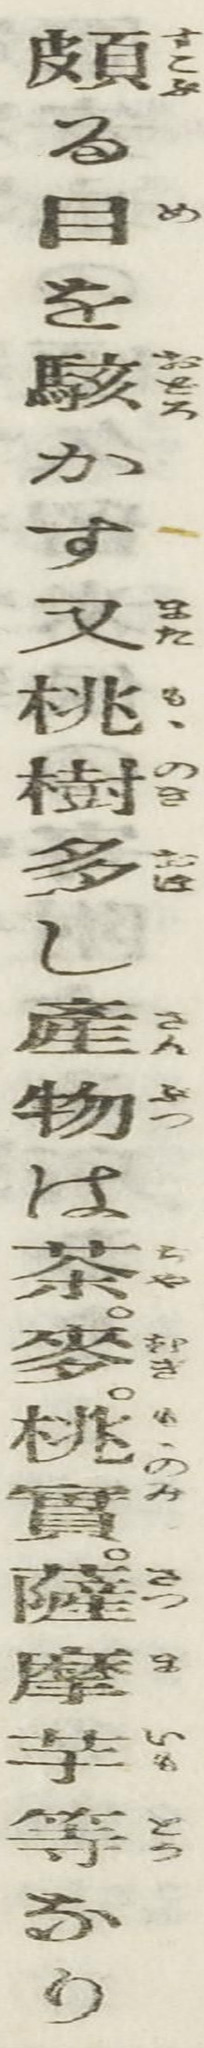頗る目を駭かす又桃樹多し産物は茶。麥。桃実。薩摩芋等なり
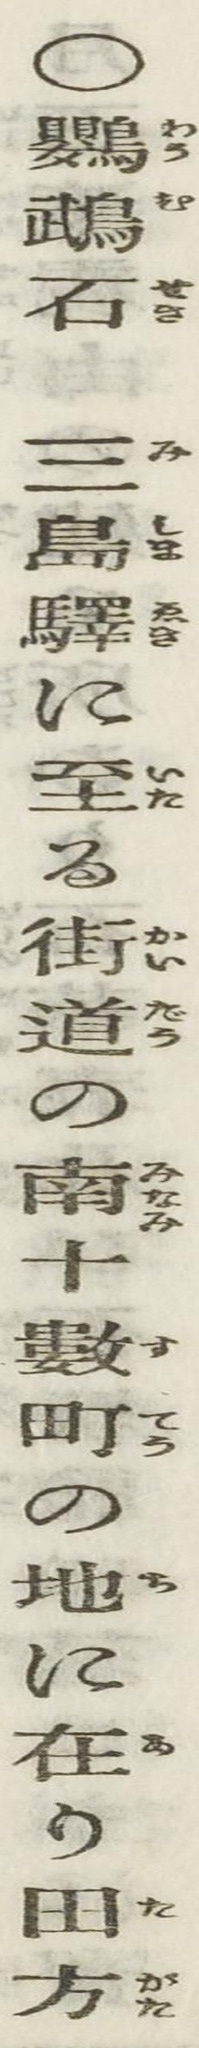○鸚鵡石三島驛に至る街道の南十数町の地に在り田方
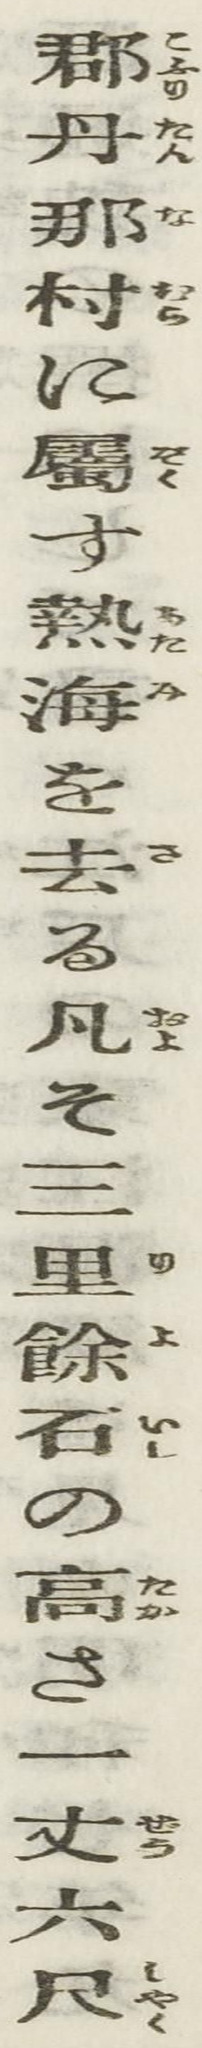郡丹那村に属す熱海を去る凡そ三里餘石の高さ一丈六尺
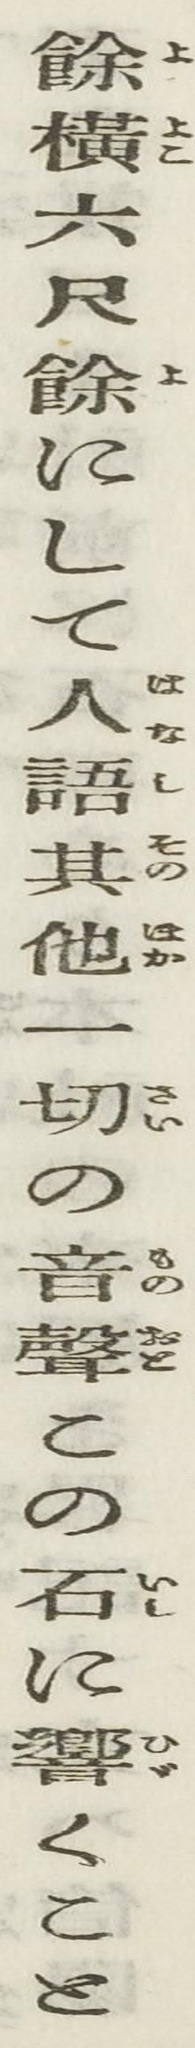餘横六尺餘にして人語其他一切の音聲この石に響くこと
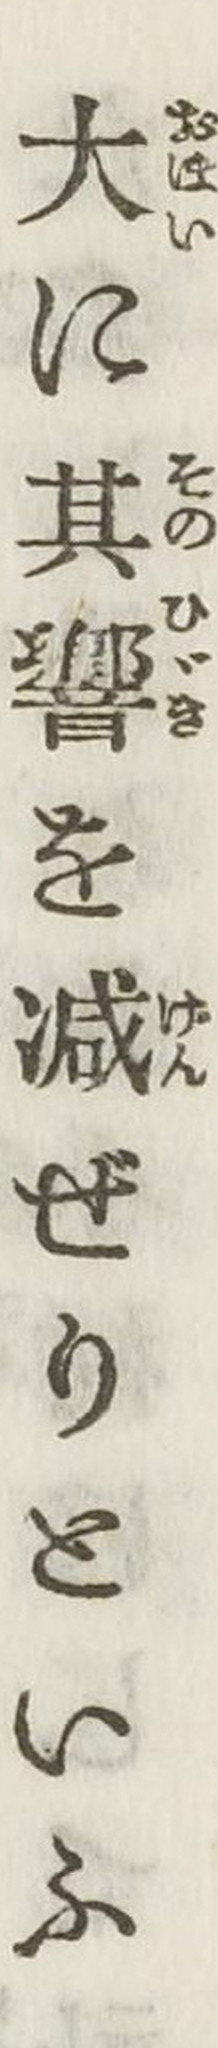大に其響を減ぜりといふ
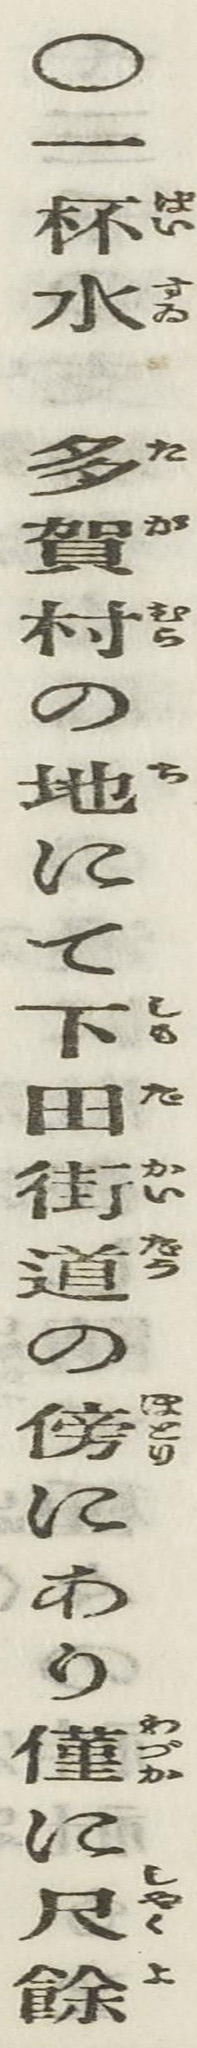○一杯水多賀村の地にて下田街道の傍にあり僅に尺餘
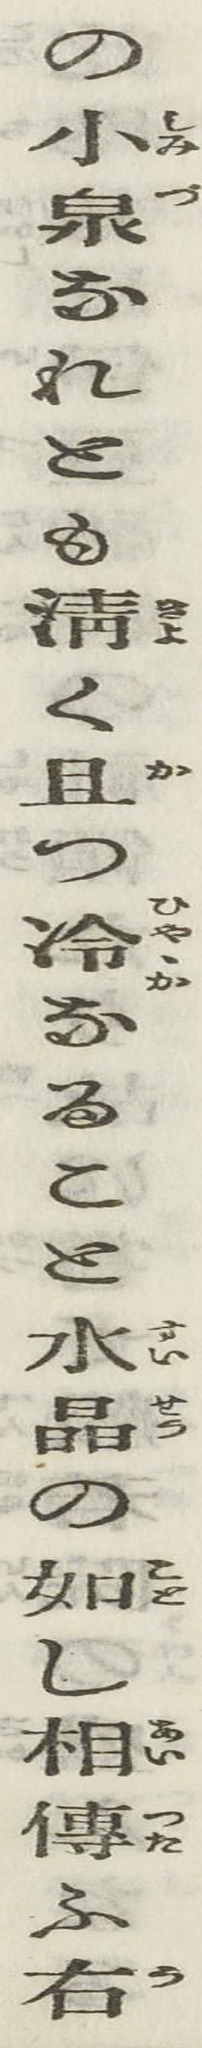の小泉なれとも清く且つ冷なること水晶の如し相伝ふ右
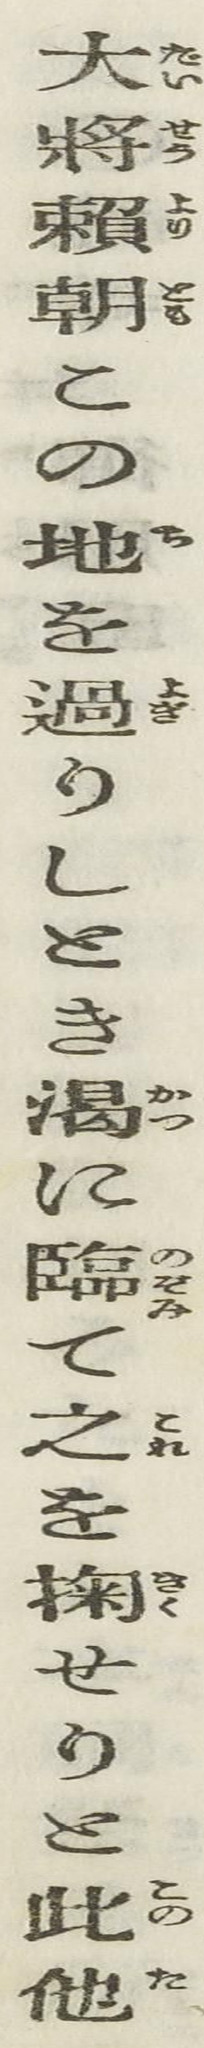大将頼朝この地を過りしとき渇に臨て之を掬せりと此他

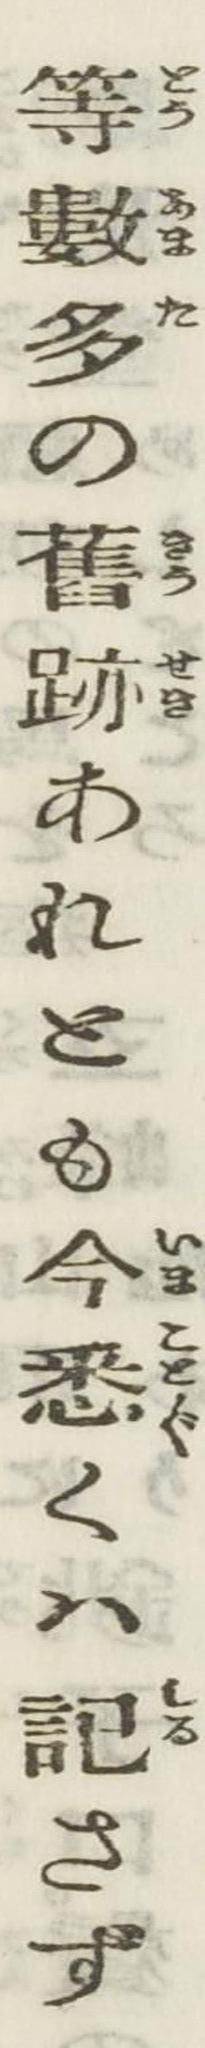等数多の旧跡あれども今悉くは記さず
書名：熱海獨案内　全
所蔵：東京大学地震研究所図書室 Earthquake Research Institute Library, The University of Tokyo, JAPAN
